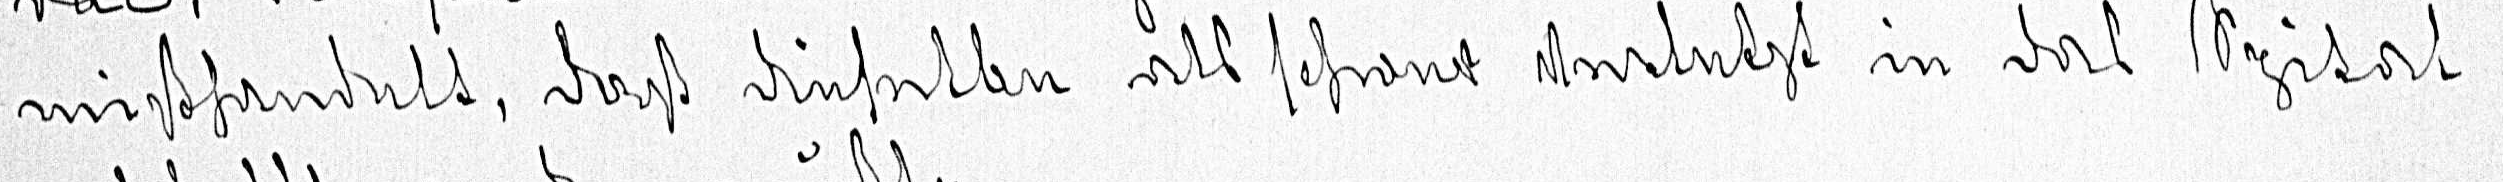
mißhandelt, daß dieselbe als schwer verletzt in das Spital
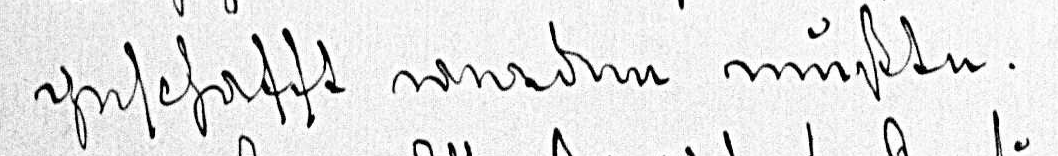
geschafft werden mußte.
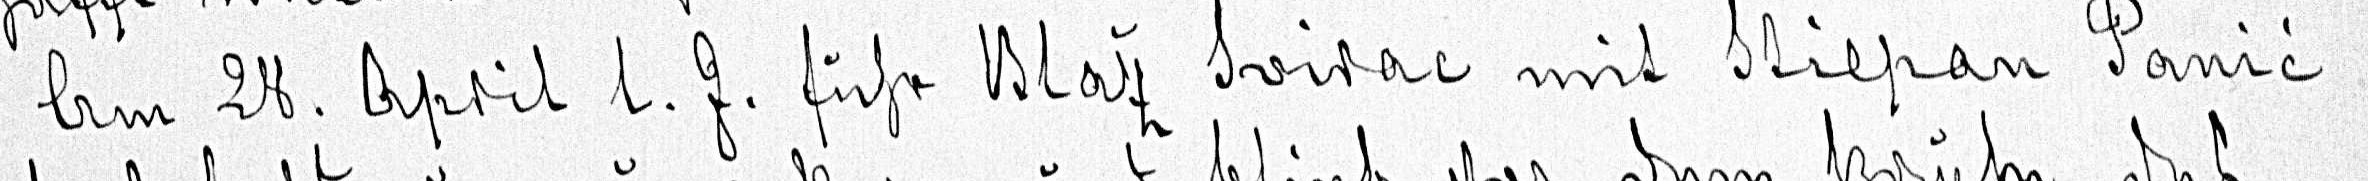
Am 28. April l. J. fuhr Blaž Svirac mit Stiepan Panić
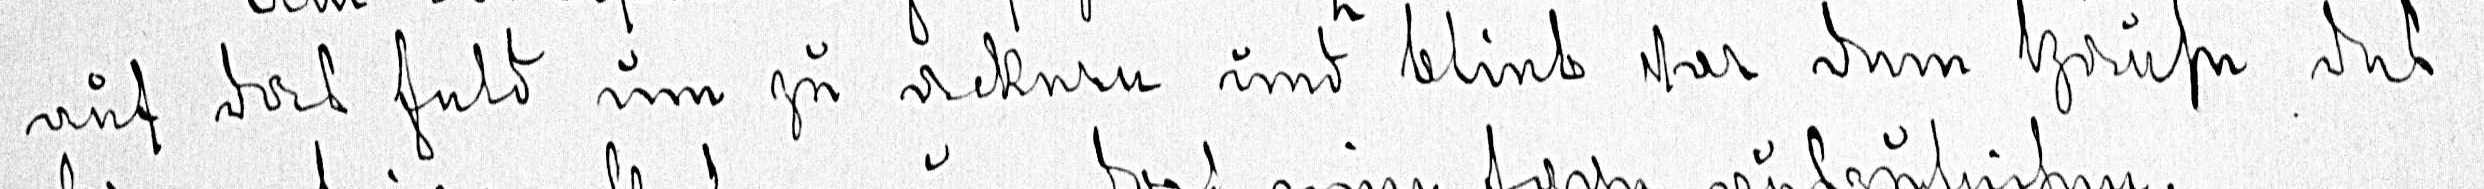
auf das Feld um zu ackern und blieb vor dem Hause des
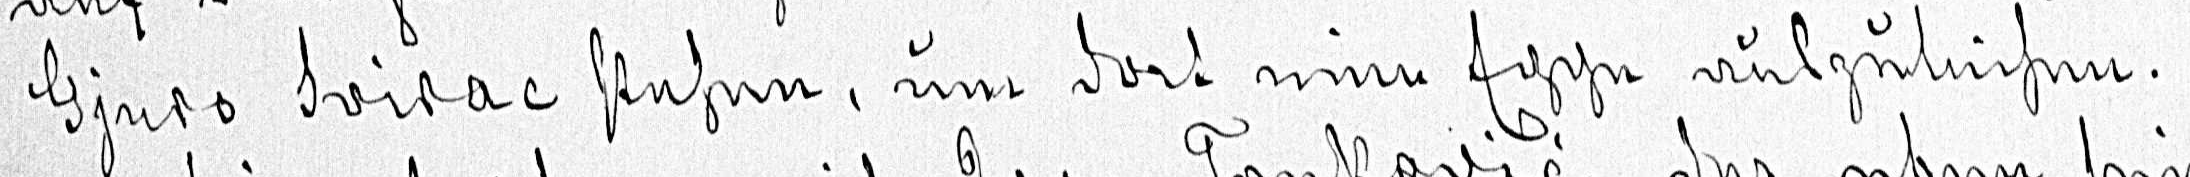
Gjuro Svirac stehen, um dort eine Egge [harrow] auszuleihen.
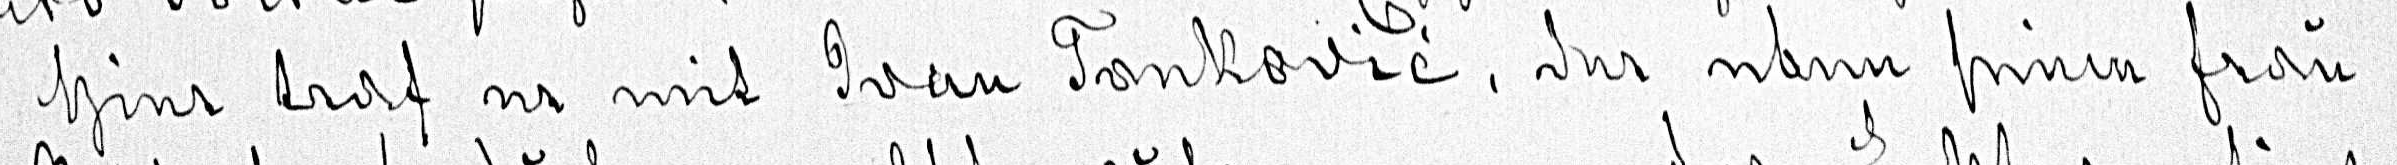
Hier traf er mit Ivan Tonković, der eben seine Frau
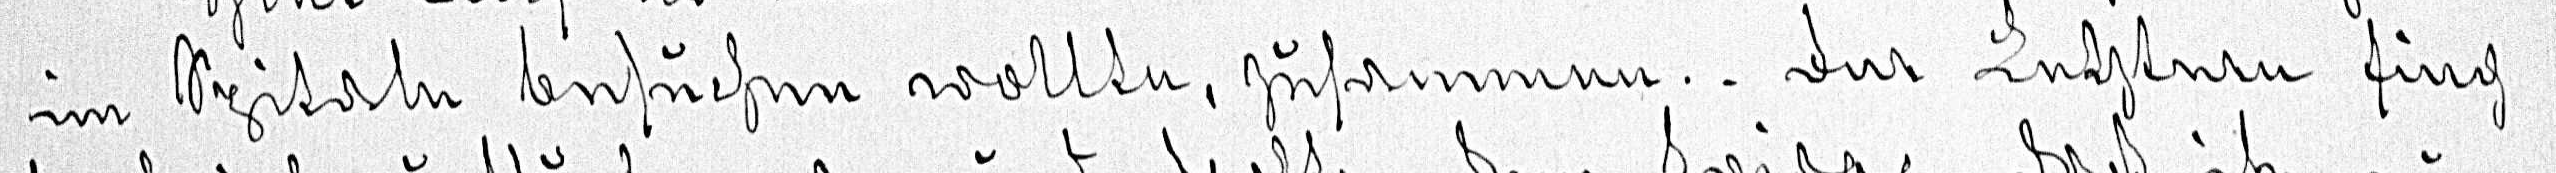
im Spitale besuchen wollte, zusammen. Der Letztere fing
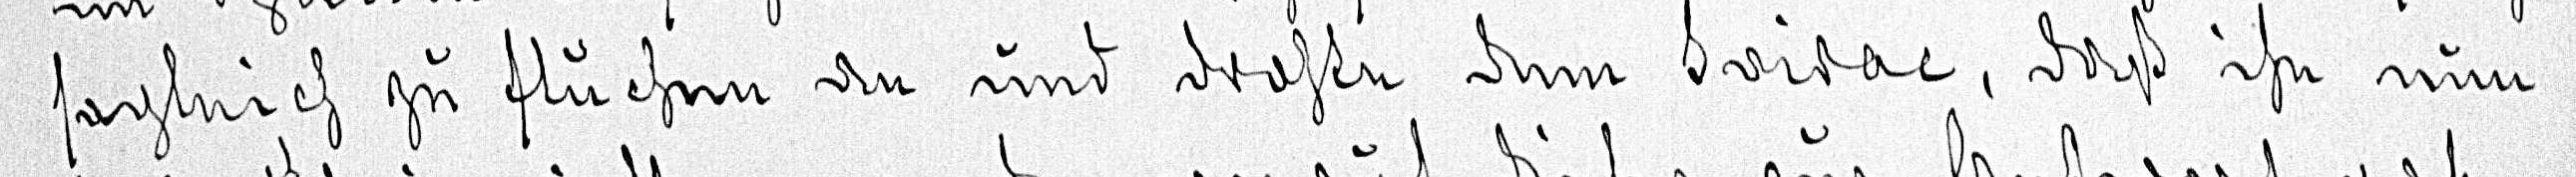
sogleich zu fluchen an und drohte dem Svirac, daß ihn nun
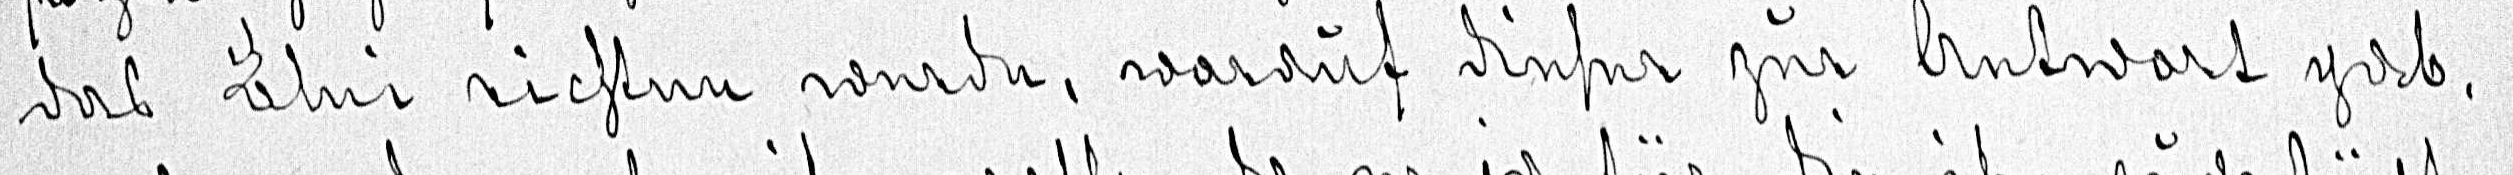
das Blei richten wurde, worauf dieser zur Antwort gab,
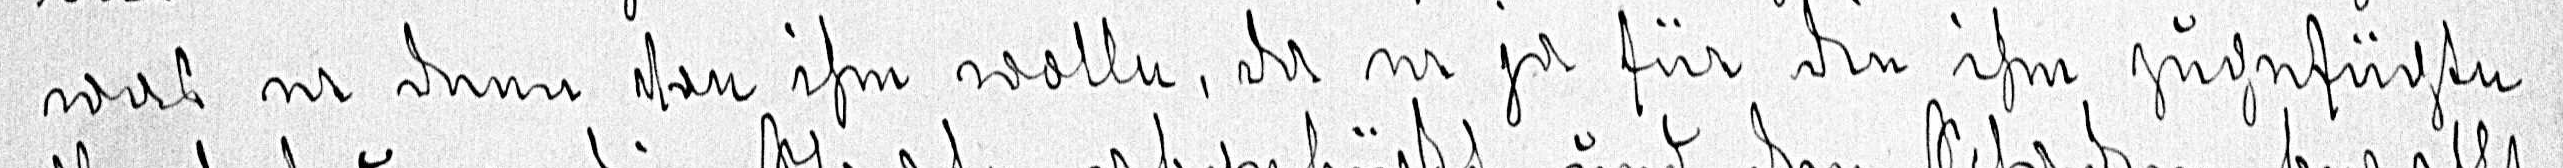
was er denn von ihm wolle, da er ja für die ihm zugefügte
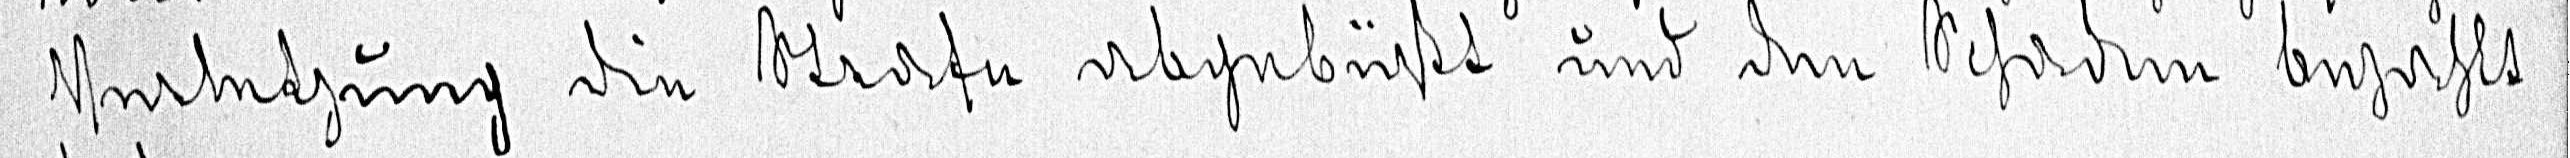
Verletzung die Strafe abgebüßt und den Schaden bezahlt
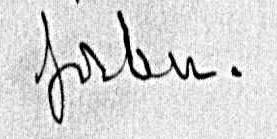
habe.
